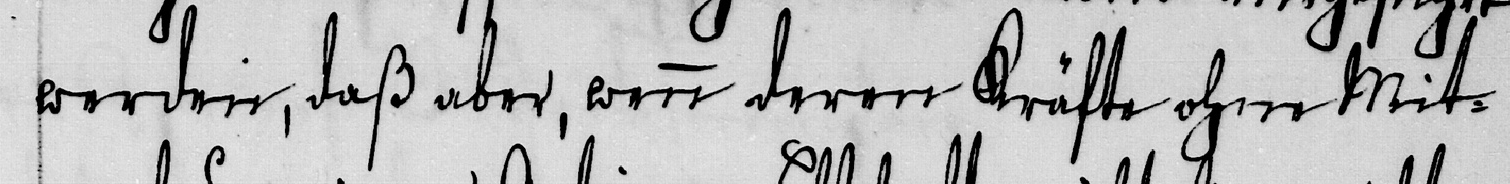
werden, daß aber, wenn deren Kräfte ohne Mit¬
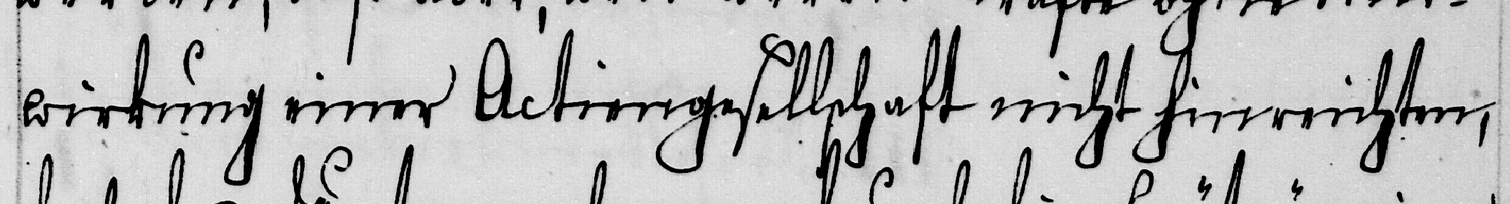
wirkung einer Actiengesellschaft nicht hinreichten,
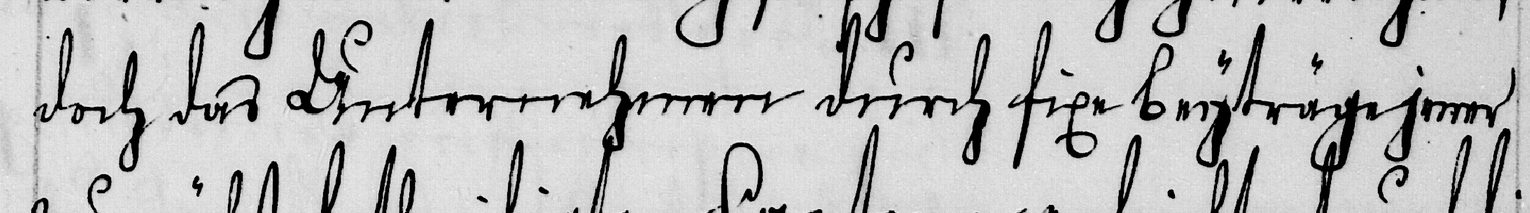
doch das Unternehmen durch fixe Beyträge jener
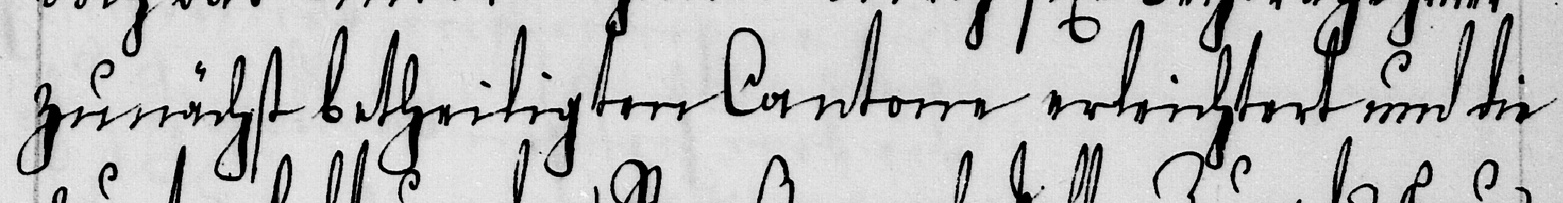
zunächst betheiligten Cantone erleichtert und die
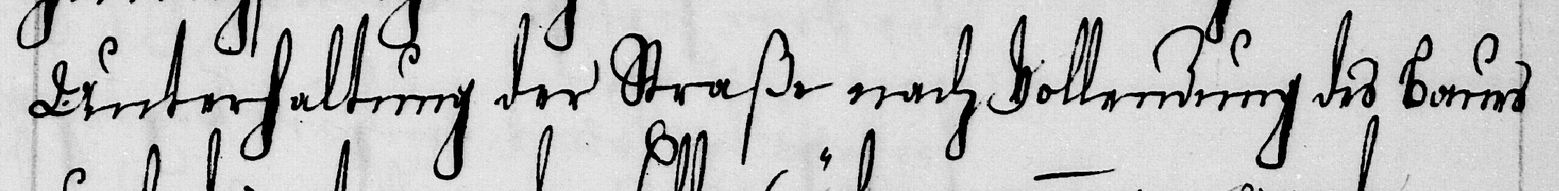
Unterhaltung der Straße nach Vollendung des Baues
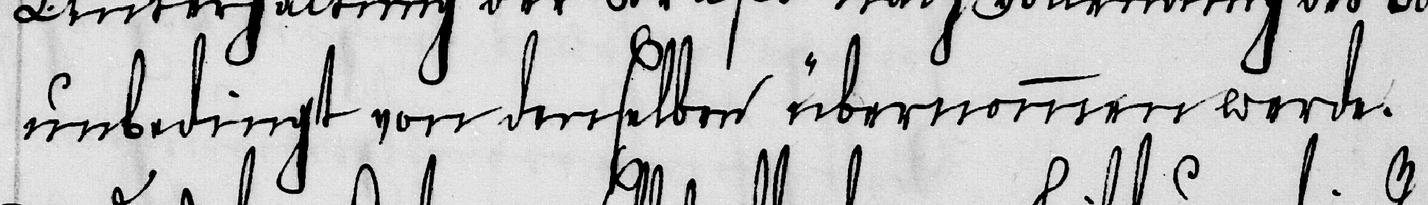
unbedingt von denselben übernommen werde.
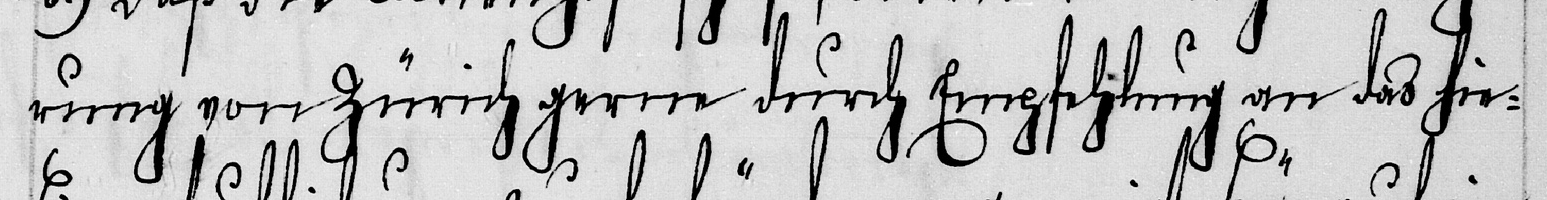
rung von Zürich gerne durch Empfehlung an das hie¬
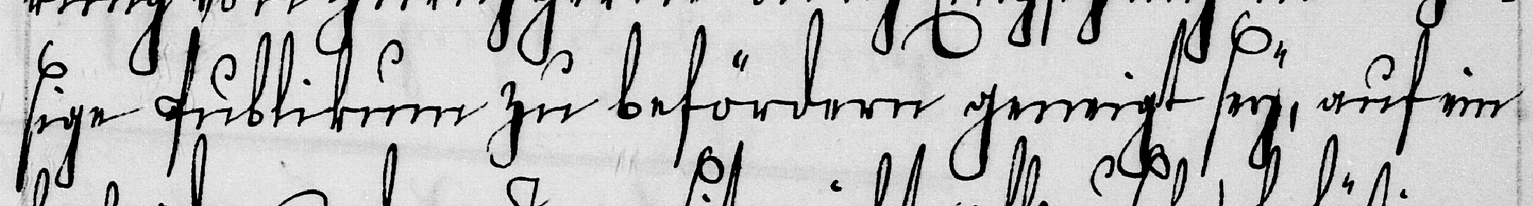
sige Publikum zu befördern geneigt sey, auf ein
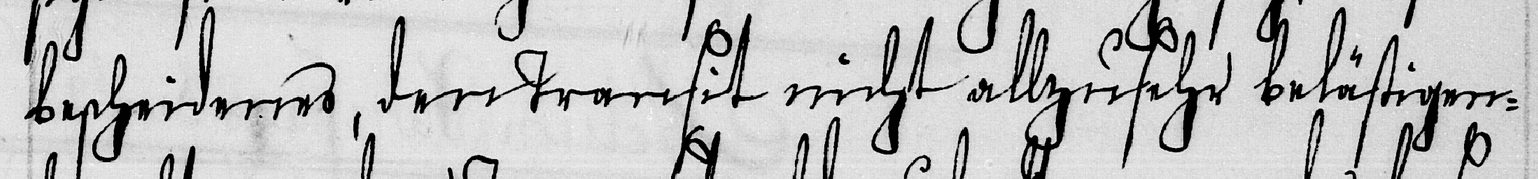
bescheidenes, den Transit nicht allzusehr belästigen¬
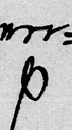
d.)
